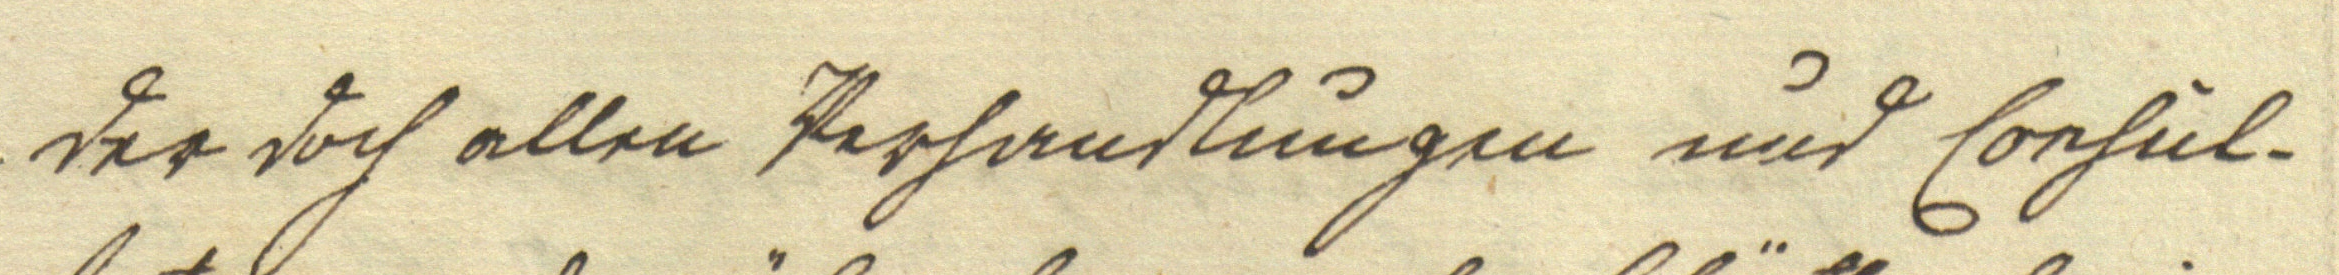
der doch allen Verhandlungen und Consul¬
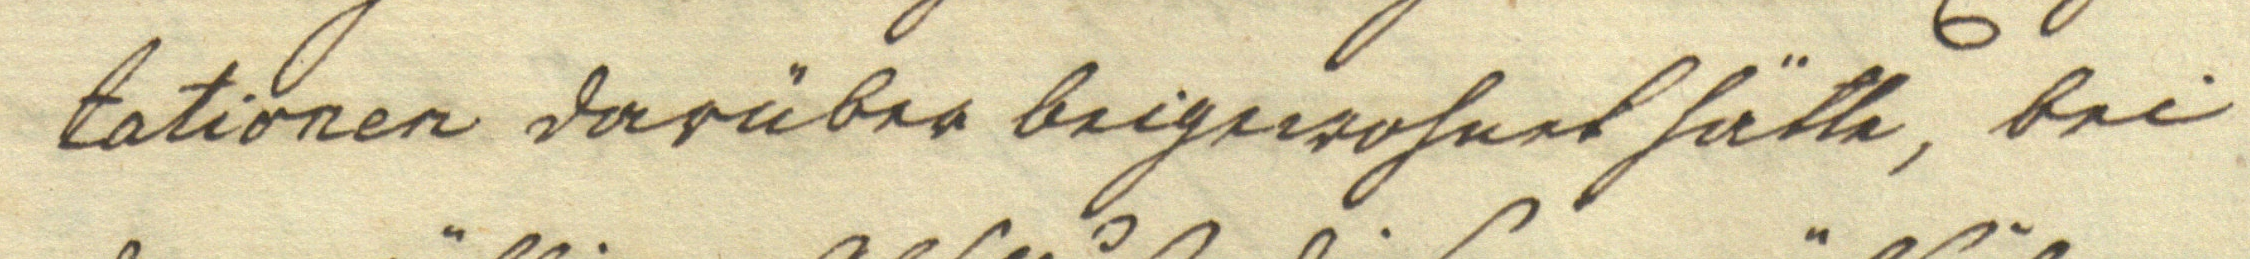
tationen darüber beigewohnet hätte, bei
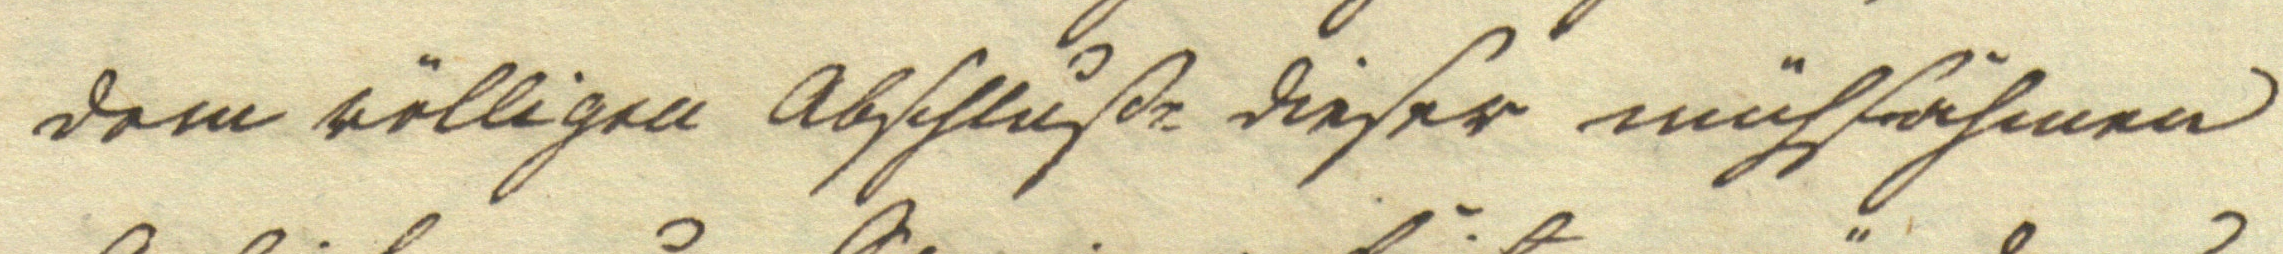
dem völligen Abschluße dieser mühsahmen
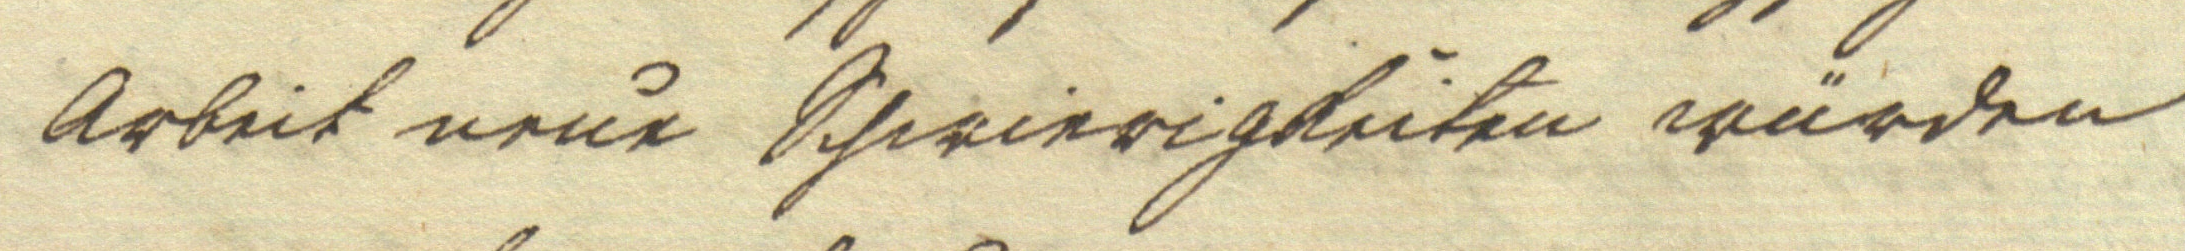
Arbeit neue Schwierigkeiten würden
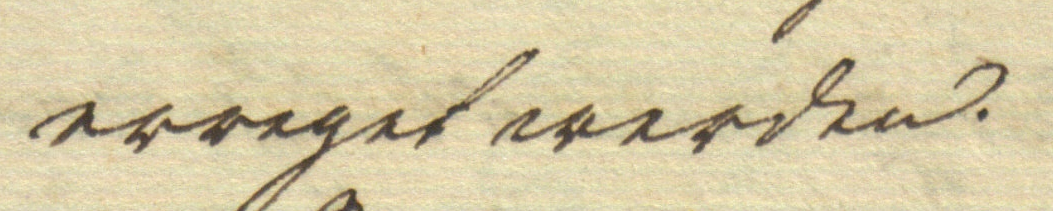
erreget werden.
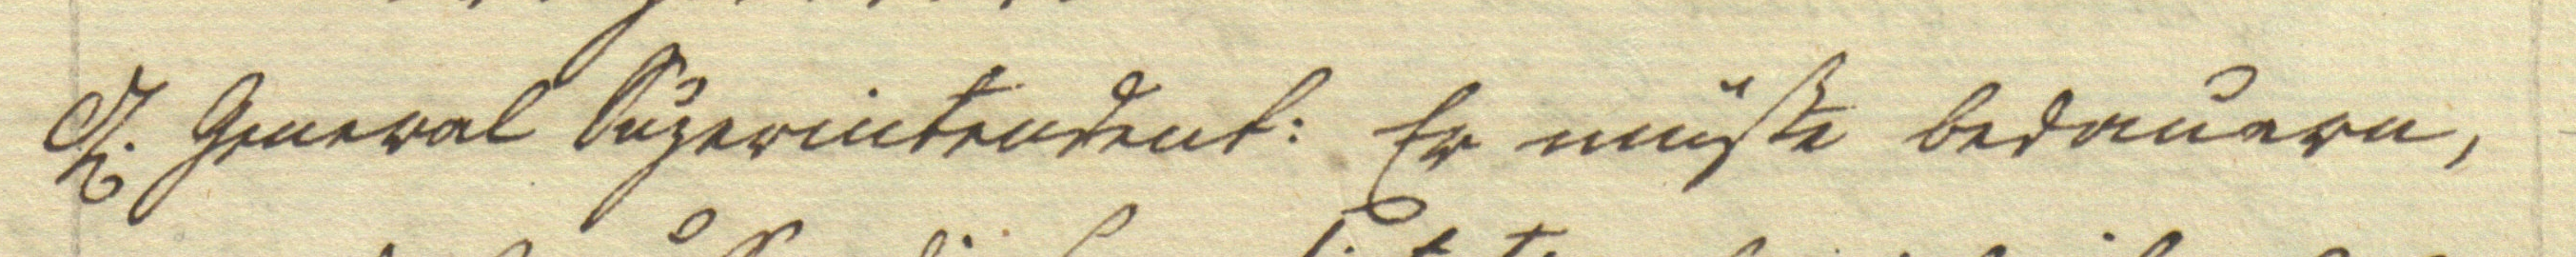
dh. General Superintendent. Er müßte bedauern,
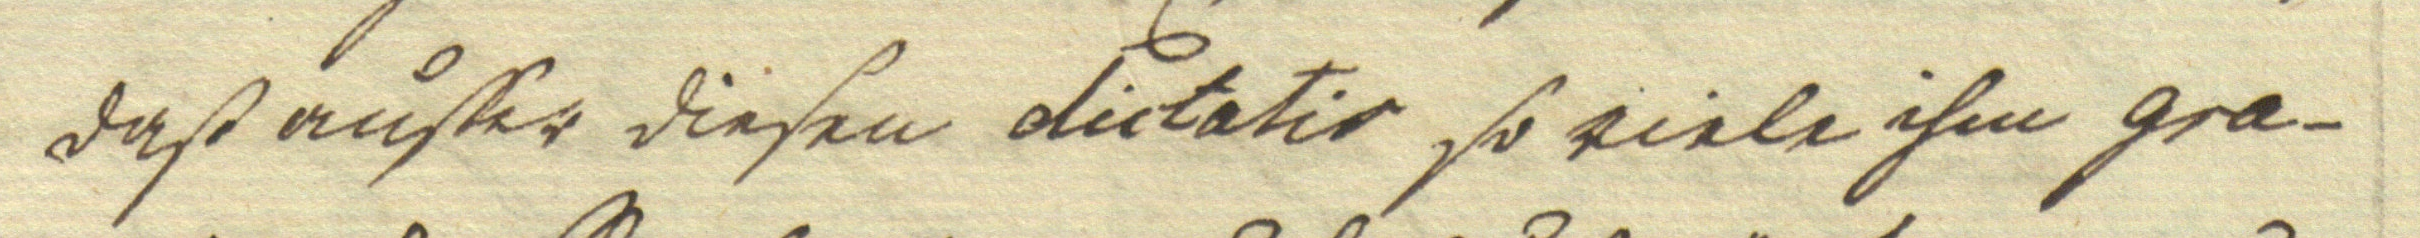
daß ausser diesen dictatis so viele ihm gra¬
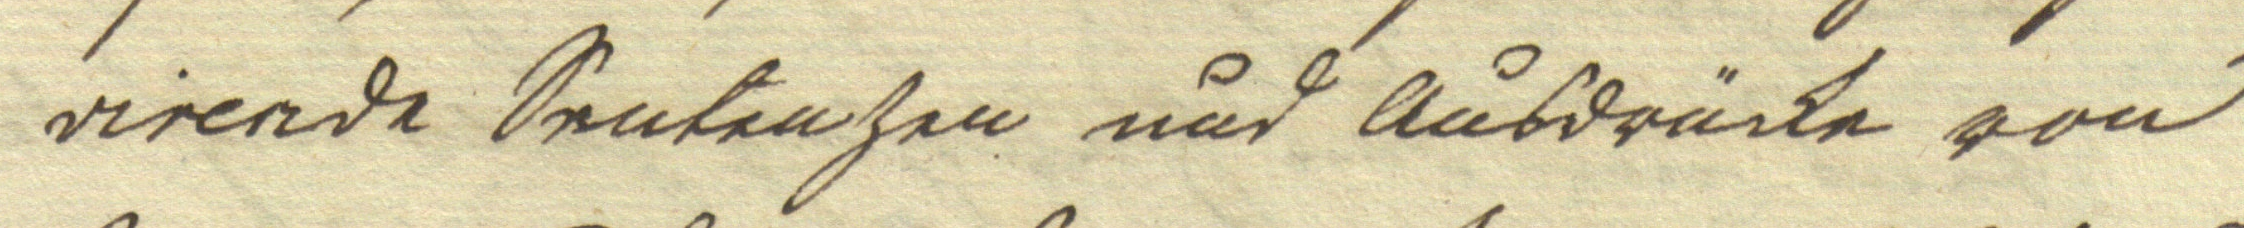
virende Sentenzen und Ausdrücke von
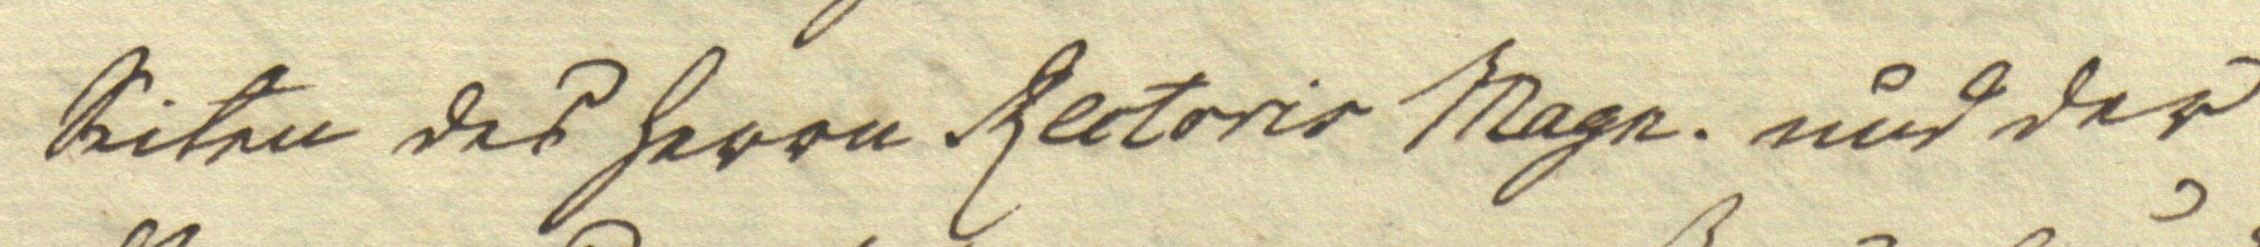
Seiten des Herrn Rectoris Magn. und der
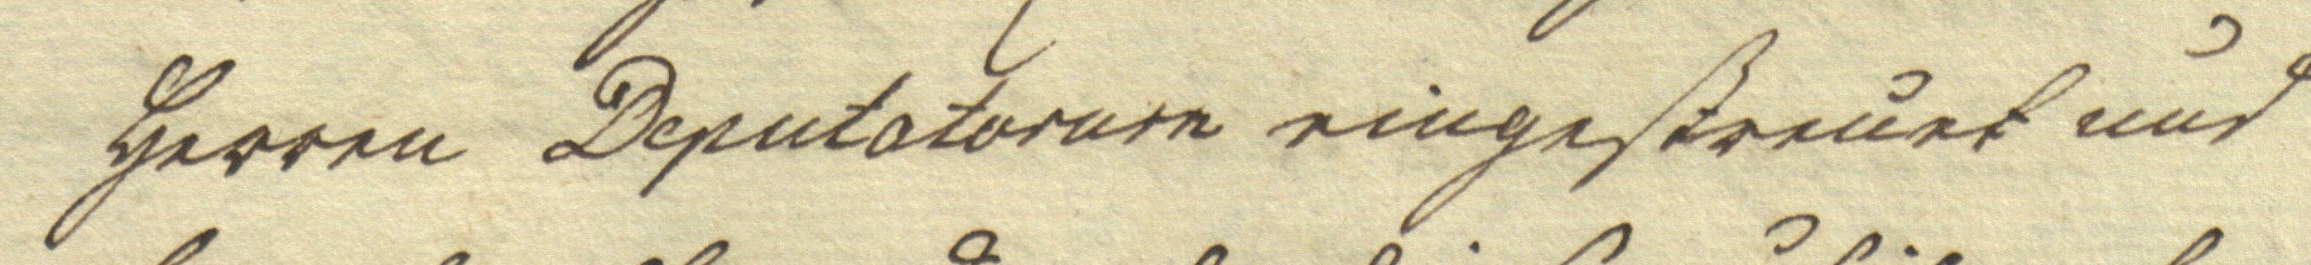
Herren Deputatorum eingestreuet und
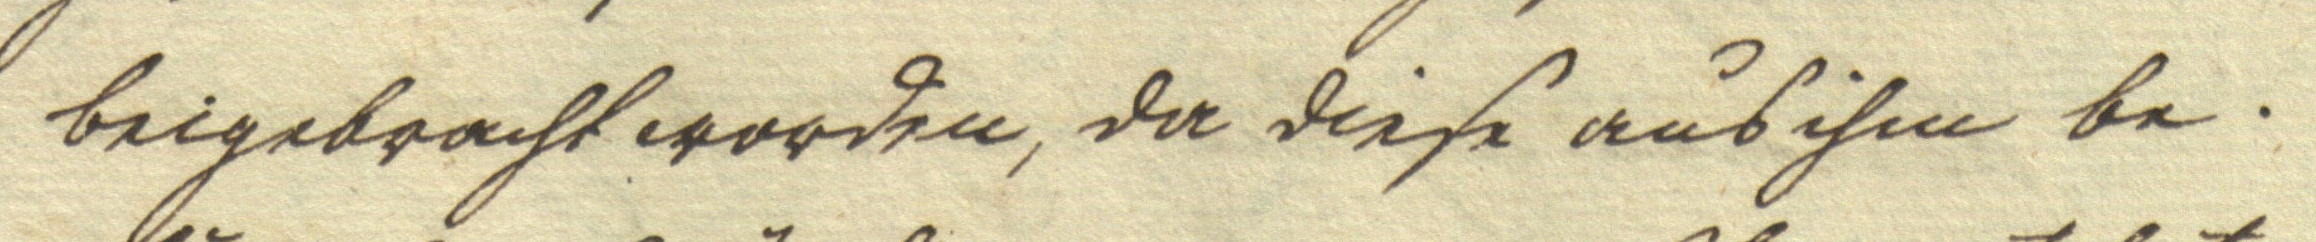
beigebracht worden, da diese aus ihm be¬
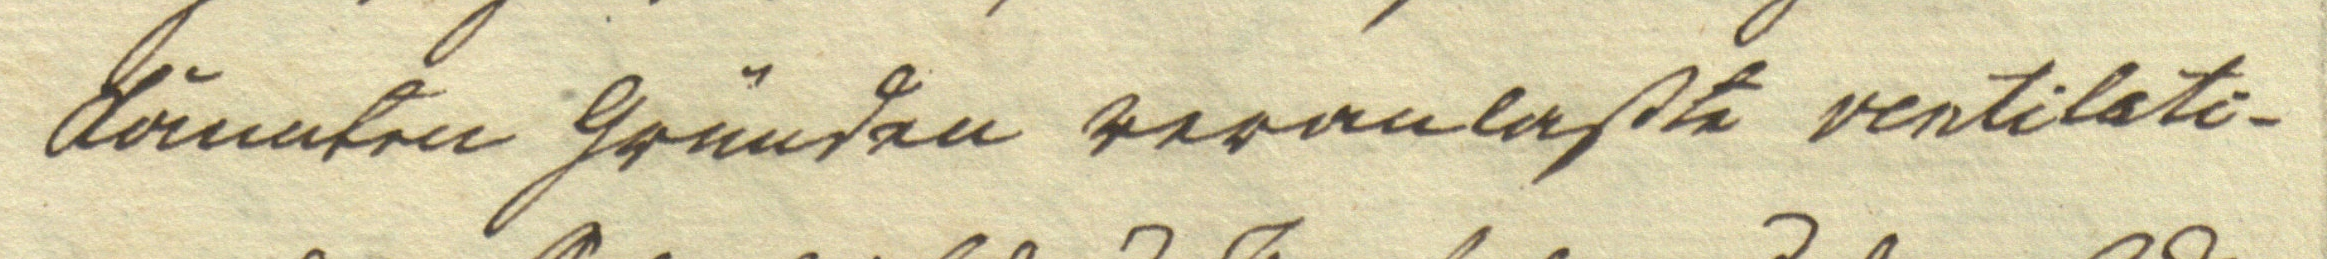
kannten Gründen veranlaßte ventilati¬
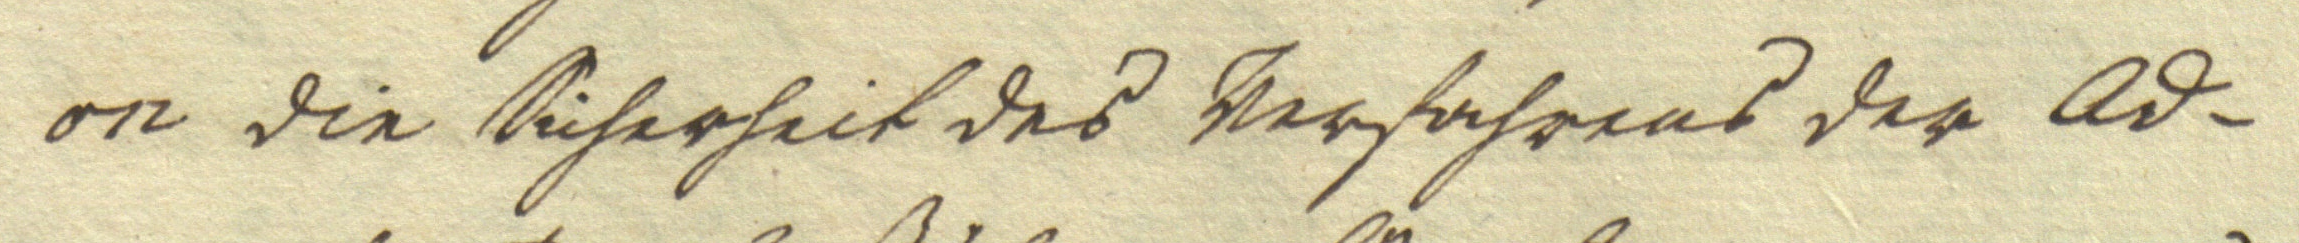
on die Sicherheit des Verfahrens der Ad¬
